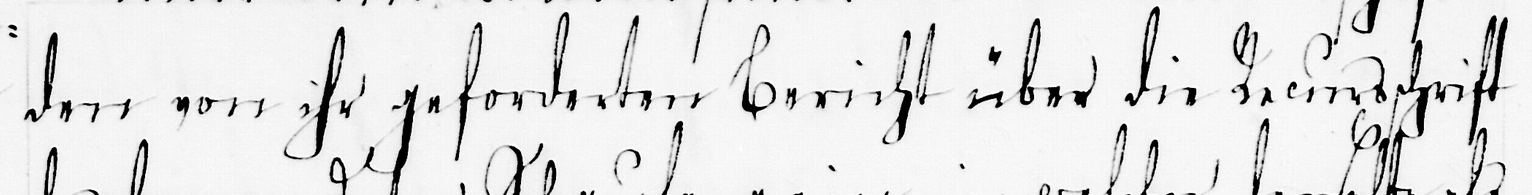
den von ihr geforderten Bericht über die Recursschri¬
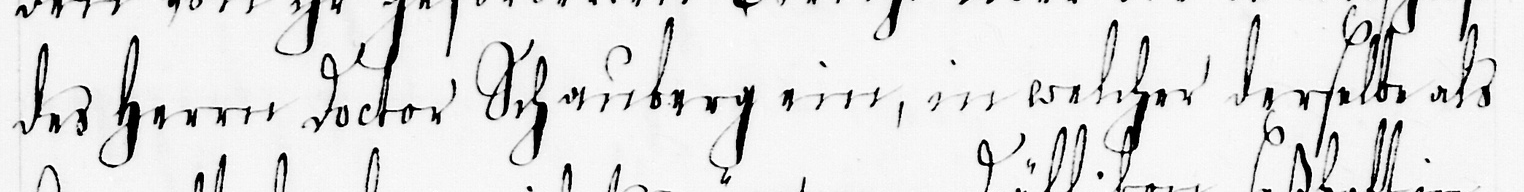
des Herrn Doctor Schauberg ein, in welcher derselbe als
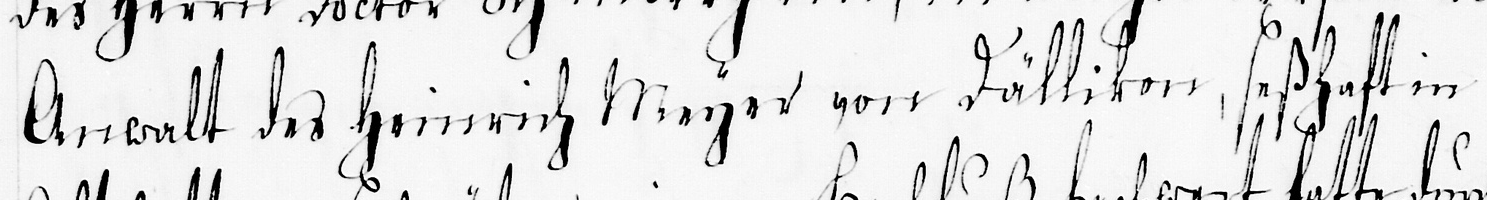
Anwalt des Heinrich Meyer von Dällikon, seßhaft in
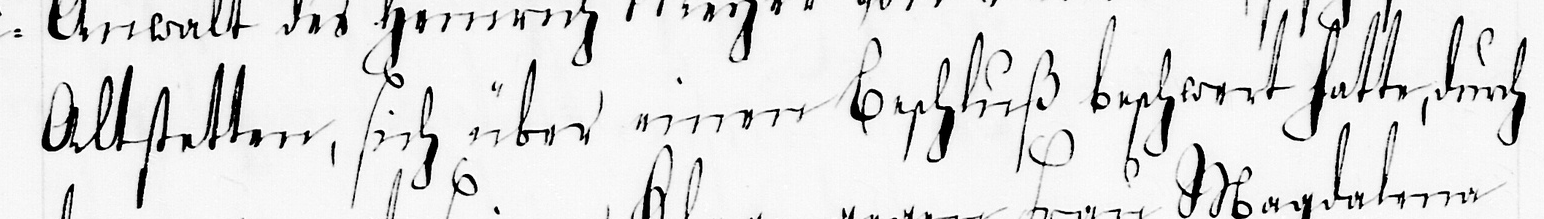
Altstetten, sich über einen Beschluß beschwert hatte, dur¬
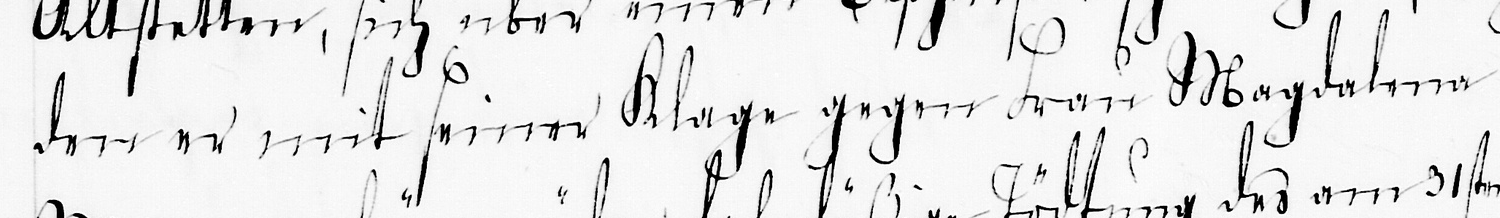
den er mit seiner Klage gegen Frau Magdalena
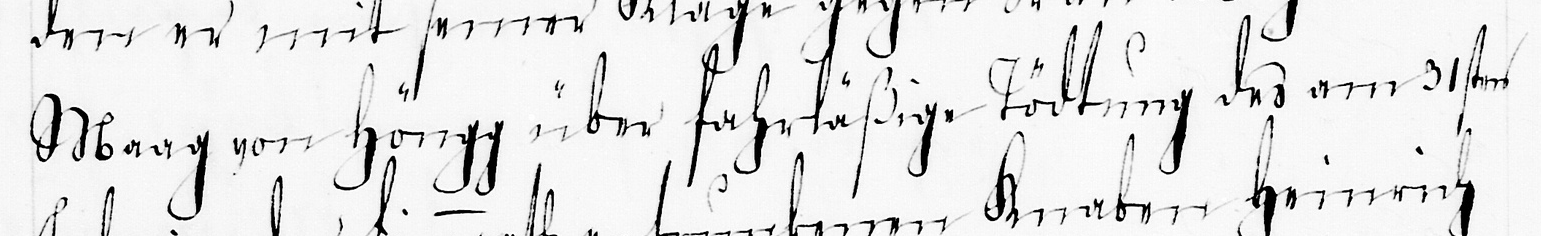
Maag von Höngg über fahrläßige Tödtung des am 31ten
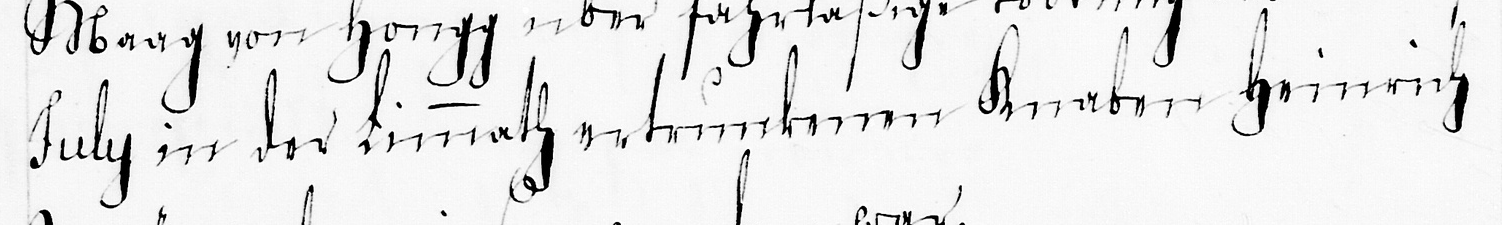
July in der Limmath ertrunkenen Knaben Heinrich
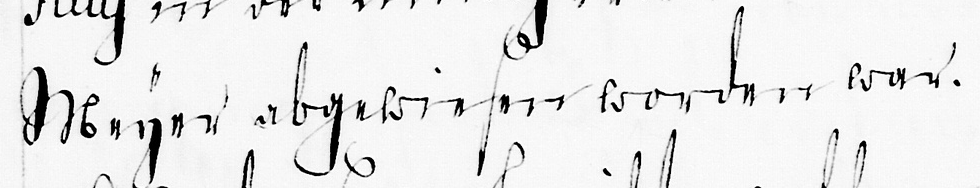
Meyer abgewiesen worden war.
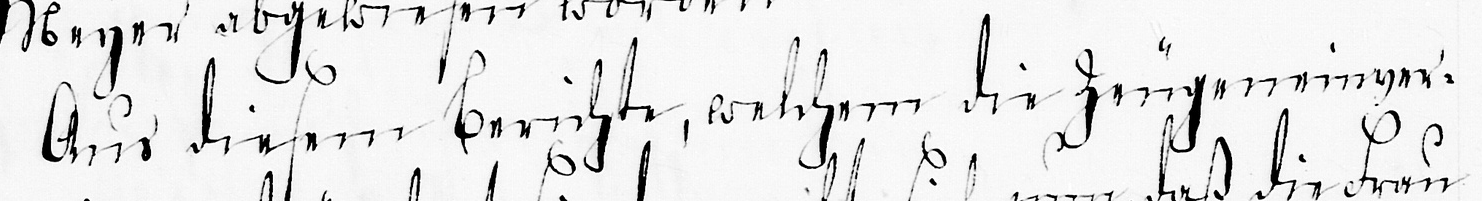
Aus diesem Berichte, welchem die Zeugeneinver¬
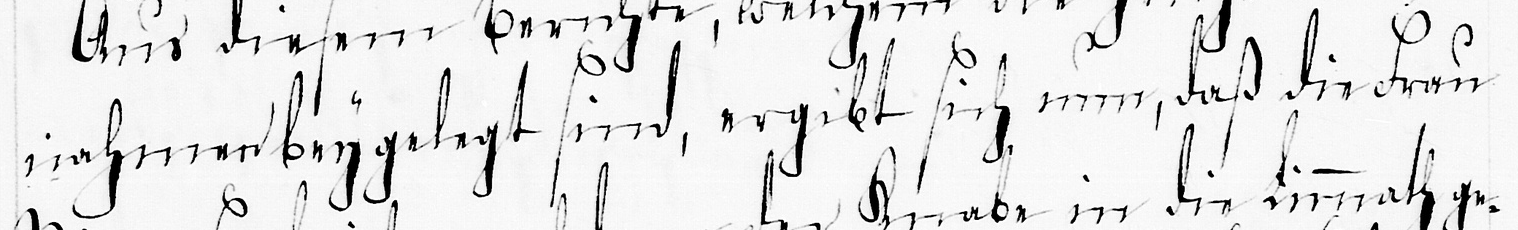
nahmen beygelegt sind, ergibt sich nun, daß die Frau
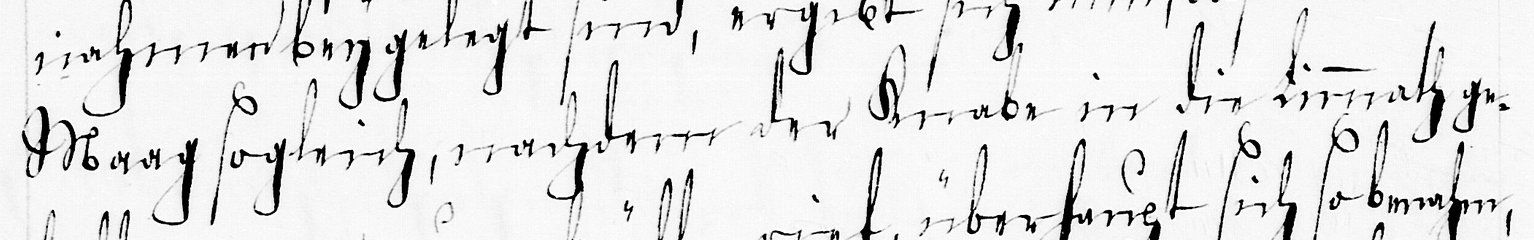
Maag sogleich, nachdem der Knabe in die Limmath ge¬
